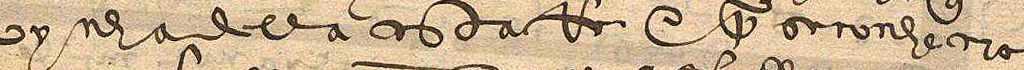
vynha della esta Re e p̄o se conhecerē
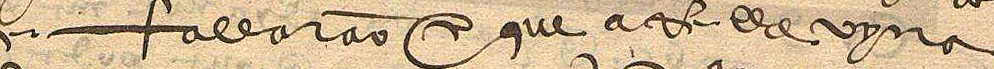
se fallarão ē q̄ a Re lhe vyera
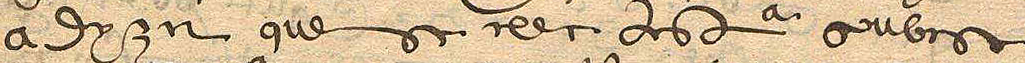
a dyzer que se elle testa soubese
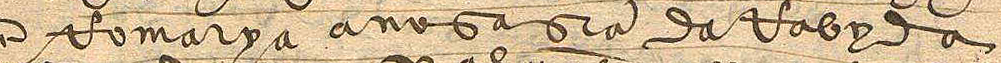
ē Romarya a nosa srā daRabyda
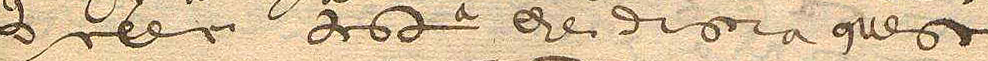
e elle testa lhe disera que se
